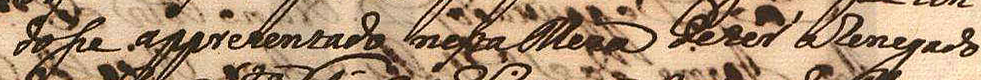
dosse apprezentado nesta Meza de ter aRenegado
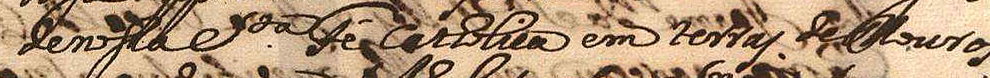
de nossa S.ta Fé Catholica em terras de Mouros
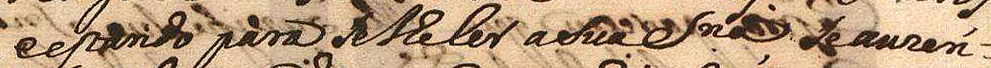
e estando para se lhe ler a sua Sna, se auzen
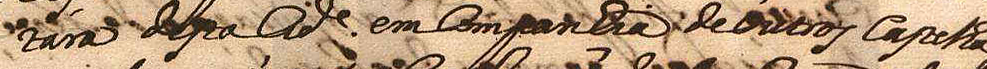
tára desta Cid.e em Companhia de outros castelha
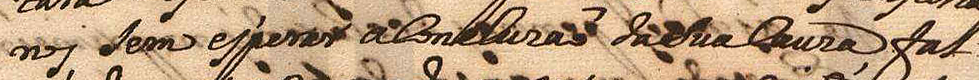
nos, sem esperar a Concluzaõ da sua Cauza faL
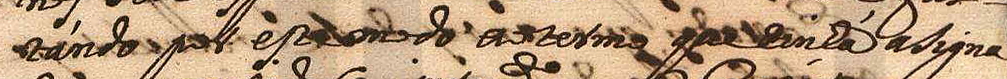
tando por este modo ao termo que tinha asigna
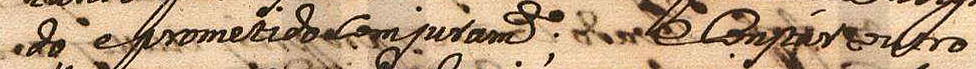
do, e prometido Com juram.to; E Constar outro
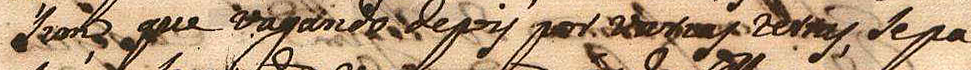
sim, que vagando depois por varias terras, se pa
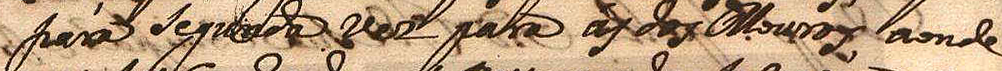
ssára segunda vez para as dos Mouros, aonde
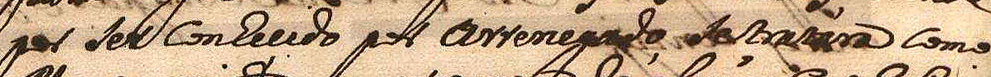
por ser conhecido por arrenegado, se tratara como
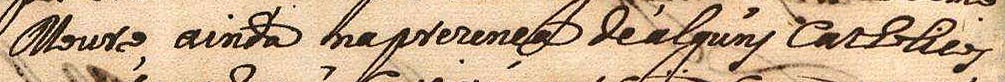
Mouro, ainda na prezença de alguns Catholicos,
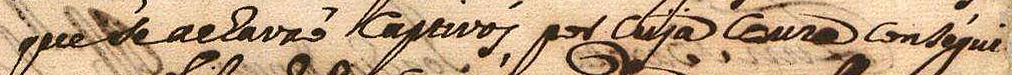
que se achavaõ Captivos, por cuja cauza consegui
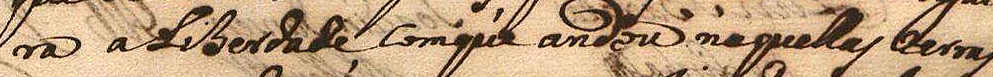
ra a Liberdade, com que andou naquellas terras
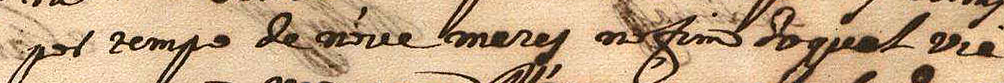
por tempo de nove mezes, no fim do qual vie
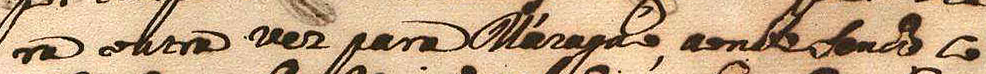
ra outra vez para Mázagaõ, aonde sendo co
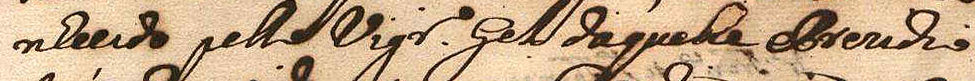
nhecido pello Vigr.o Gel daquelle Prezidio
